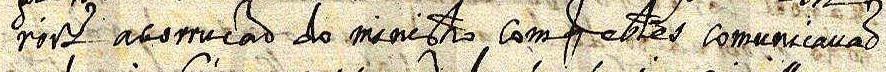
roiz̄ a corruçaõ do ministro com q̄ estes comunicauaõ
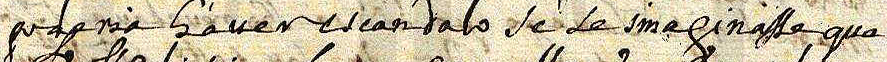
poderia hauer escandalo se se imaginasse que
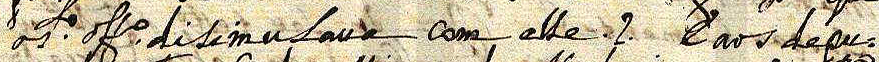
o s.to off.o disimulaua com elle ./. e aos depu
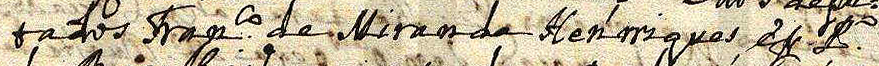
tados Fran.co de Miranda Henrriques, e fr P.o
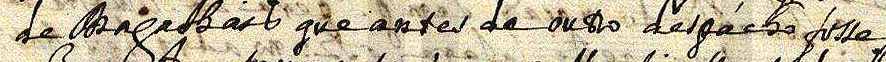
de Magalhaĩs que antes de outro despacho fosse
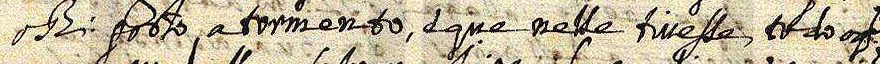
o R: posto a tormento, e que nelle tiuesse, todo o q̄
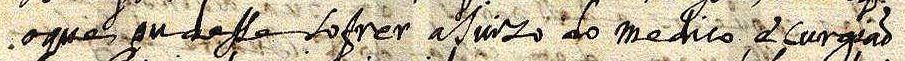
o que pudesse sofrer a Iuizo do medico, e curgiaõ
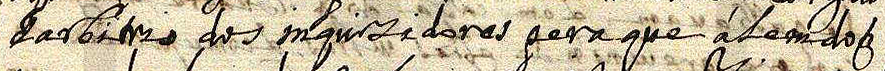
e arbitrio dos inquizidores pera que alem do q̄
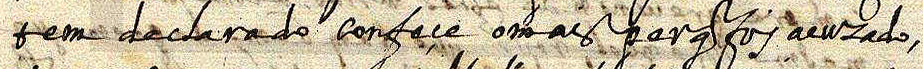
tem declarado confece o mais por q̄ foi acuzado,
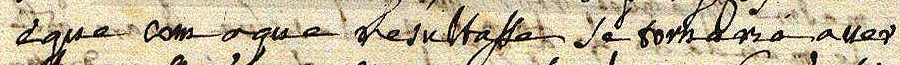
e que com o que resultasse se tornaria a uer
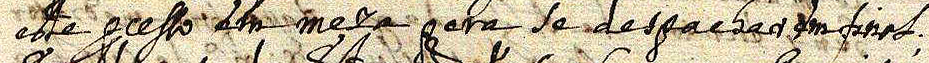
este ꝓcesso em meza para se despachar em final;
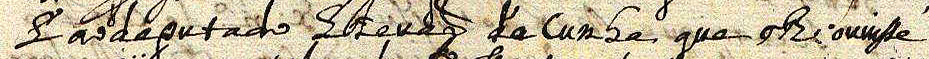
E ao deputado Esteuaõ da Cunha que o R. ouuisse
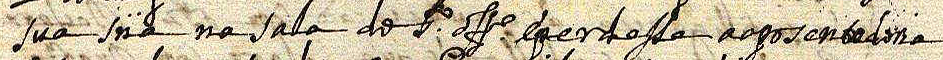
sua sn̄a na sala do s.to off.o e perdesse aposentadoria
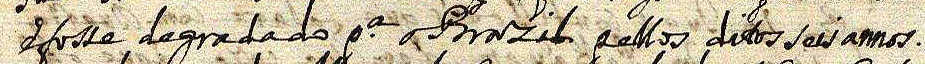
e fosse degradado p.a o Brazil pellos ditos seis annos.
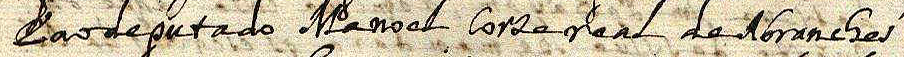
E ao deputado Manoel Corte real de Abranches
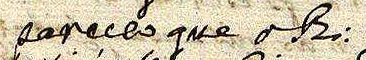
pareceo que o R:
